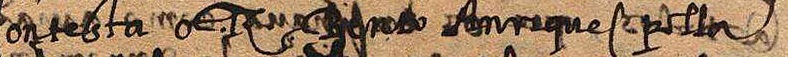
Contesta o .R. Bento Anriques polla
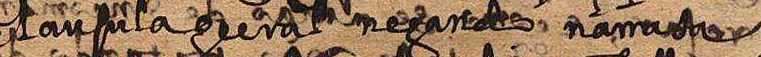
clausula geeral negando na mata
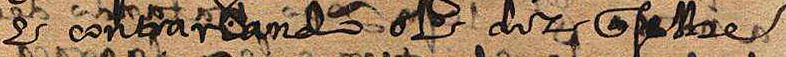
E contrariando o Lo diz q̄ se lhe
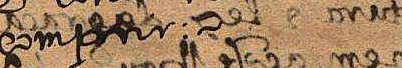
comprir:
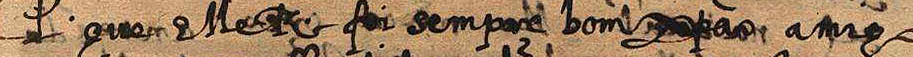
P. que Elle R. foi sempre bom xpão amigo
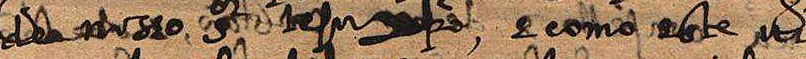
de nosso sor iesu xpō, E como este ui
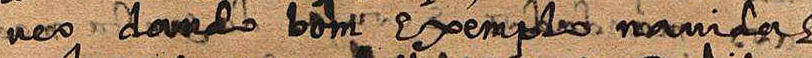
ueo damdo bom Exemplo na vida E
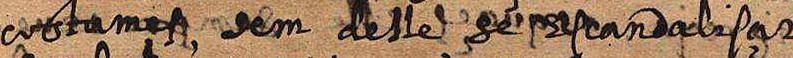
costumes, sem delle se Escandalisar
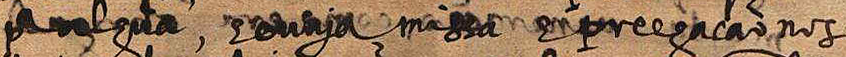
pa algūa, E ouuja missa E preegaçaõ nos
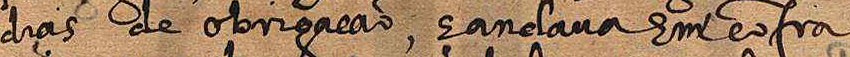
dias de obrigaçaõ, E andaua Em cōfra
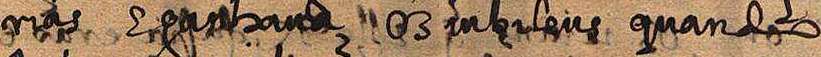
rias E ganhaua os iubileus quando
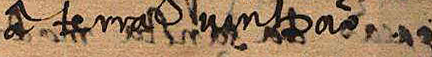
â terra uinhaõ.
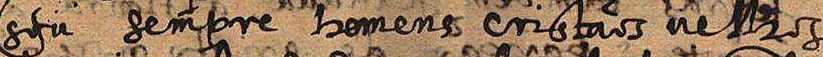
sou sempre homens cristaõs uelhos
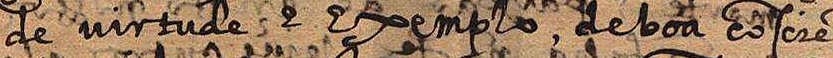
de uirtude E Exemplo, de boa cōsciē
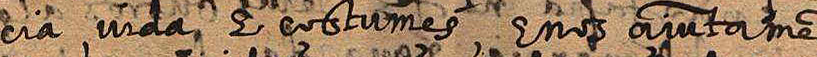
cia, uida E costumes, E nos aiūtamē
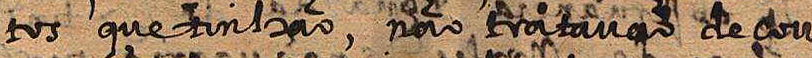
tos que tinhão, não tratauaõ de cou
